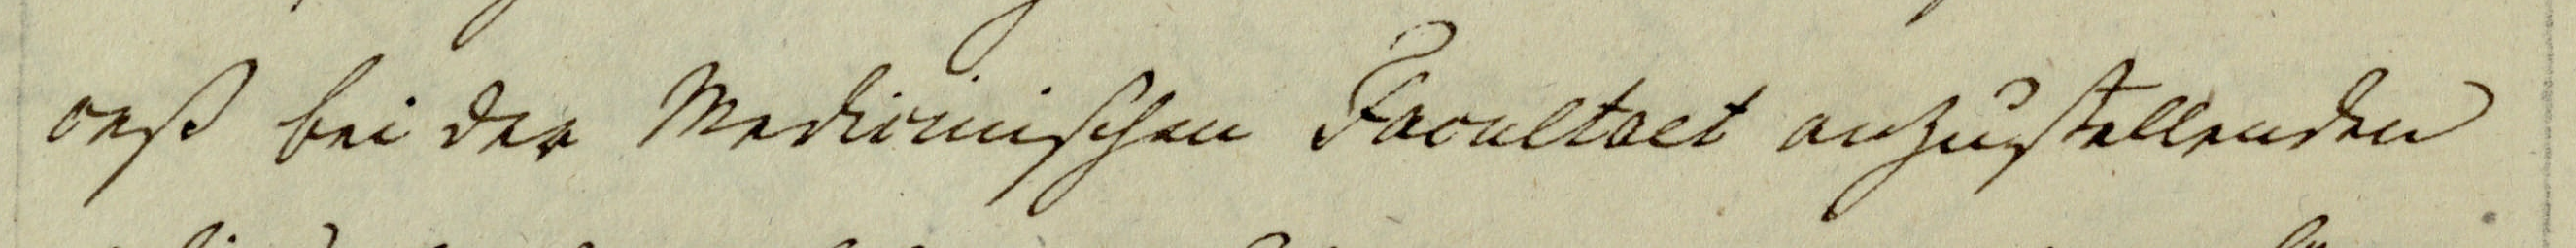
ceß bei der Medicinischen Facultaet anzustellenden
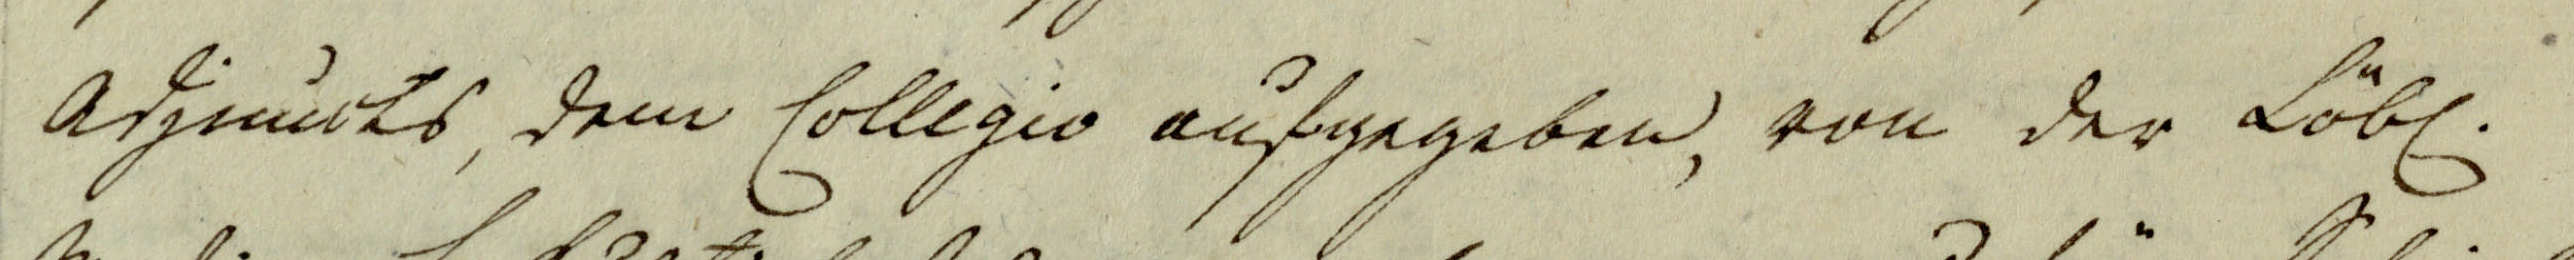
Adjuncts, dem Collegio aufgegeben, von der Löbl.
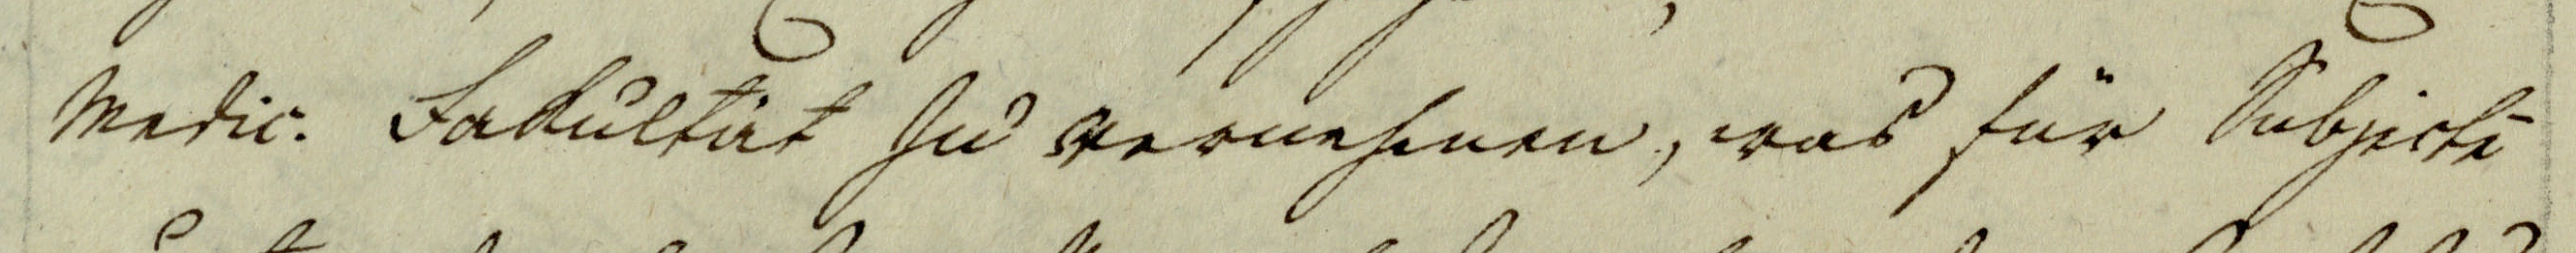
Medic. Fakultät zu vernehmen, was für Subjecte
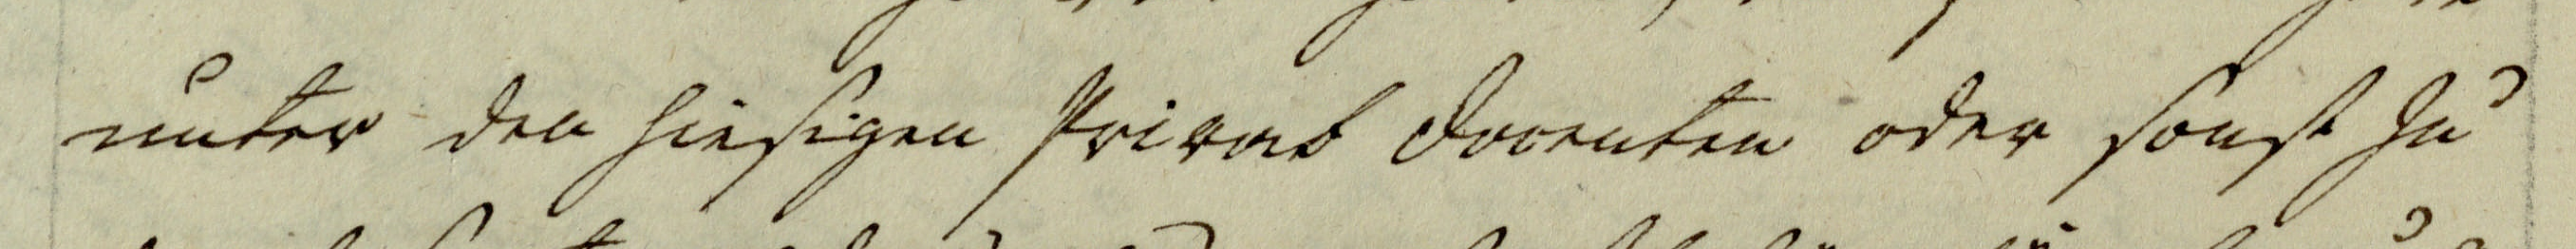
unter den hiesigen Privat Docenten oder sonst zu
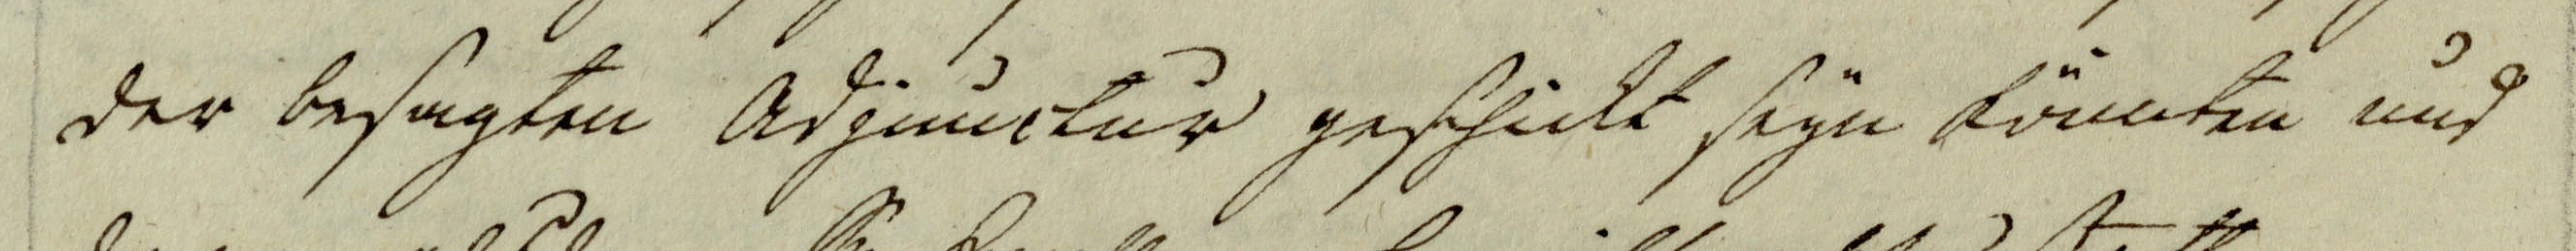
der besagten Adjunctur geschickt seÿn könnten und
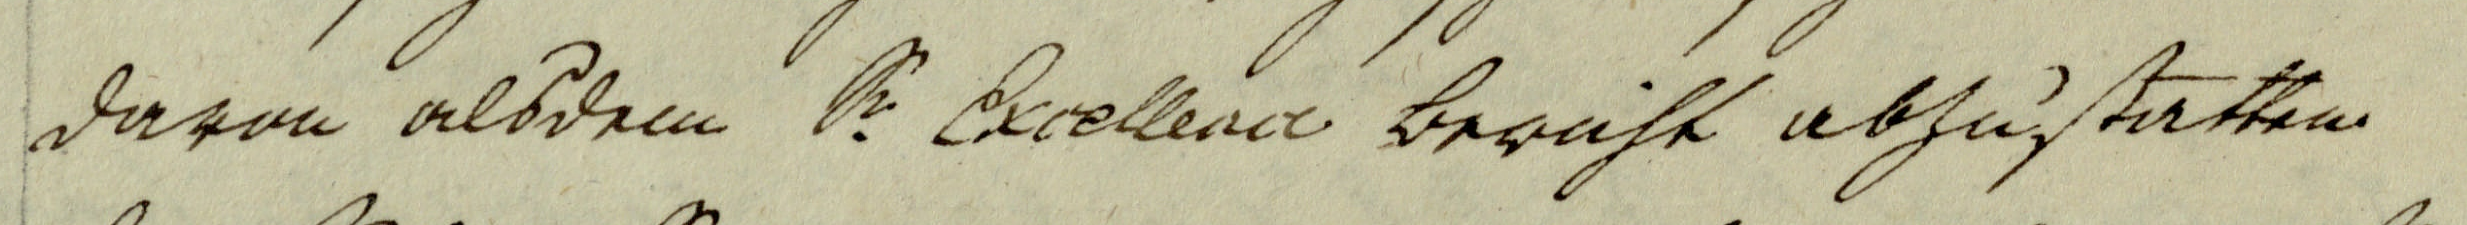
davon alsdenn Sr Excellence Bericht abzustatten.
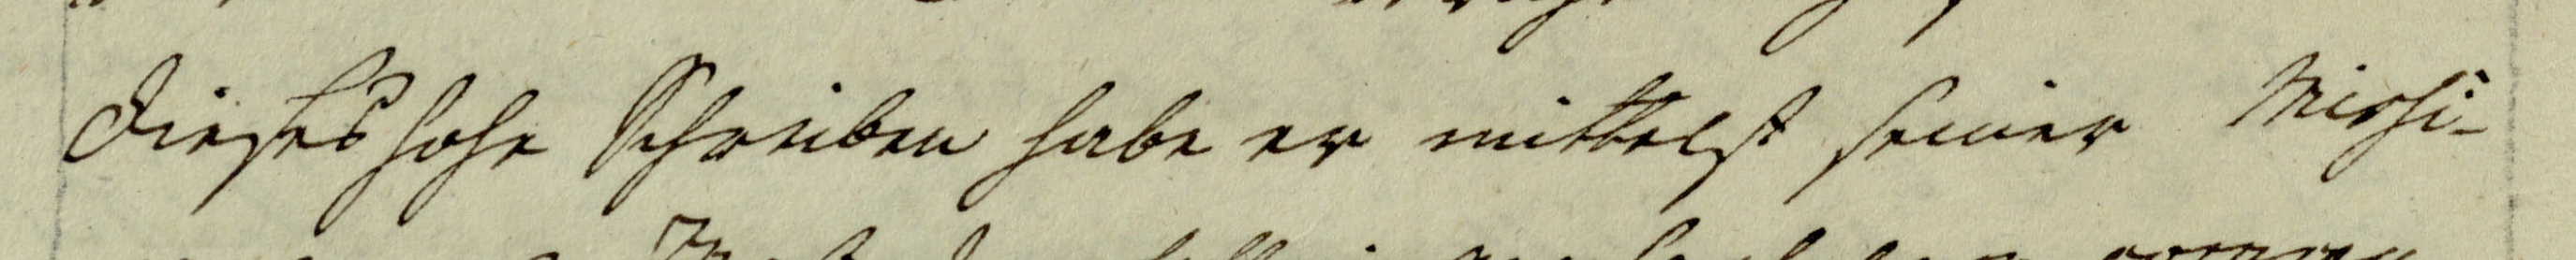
Dieses hohe Schreiben habe er mittelst seiner Missi¬
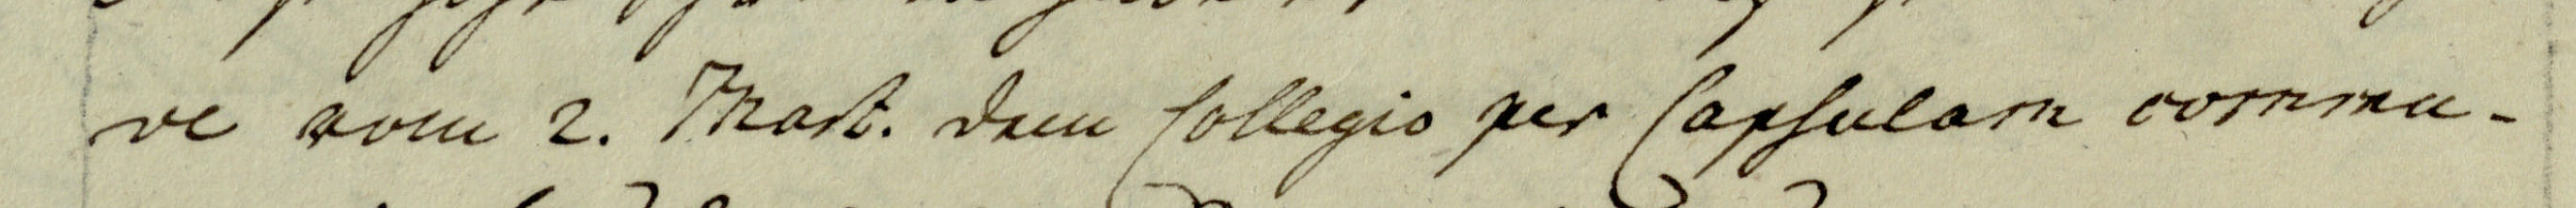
ve vom 2. Mart. dem Collegio per Capsulam commu-
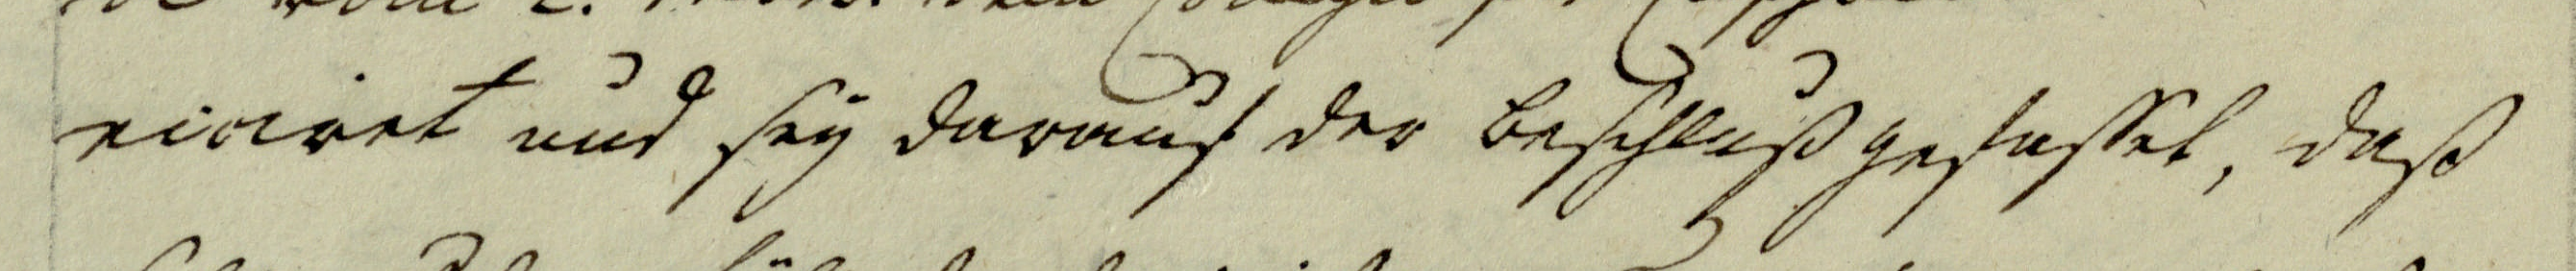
niciret und sey darauf der Beschluß gefasset, daß
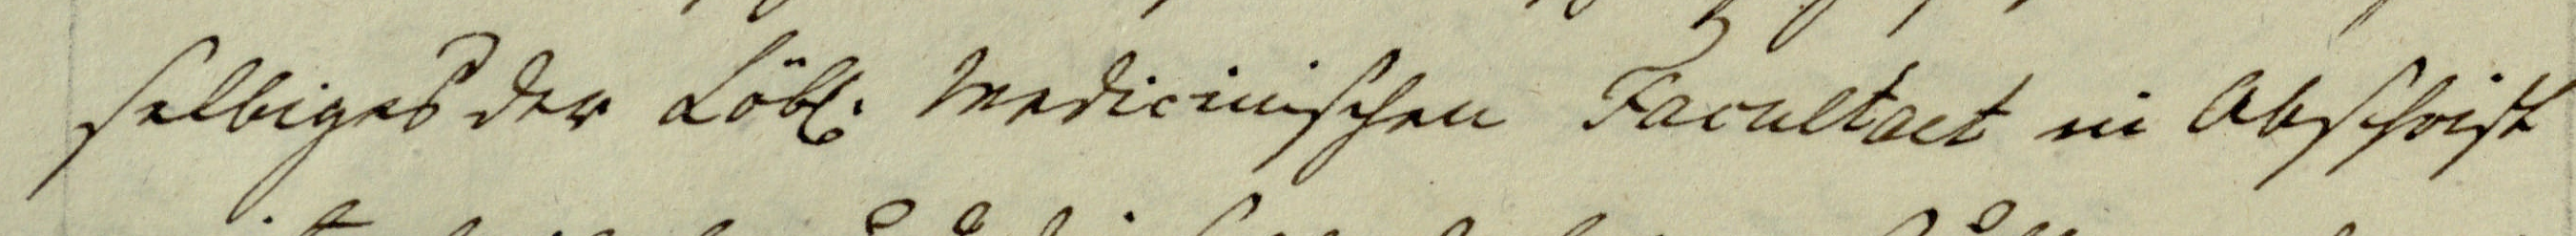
selbiges der Löbl. Medicinischen Facultaet in Abschrift
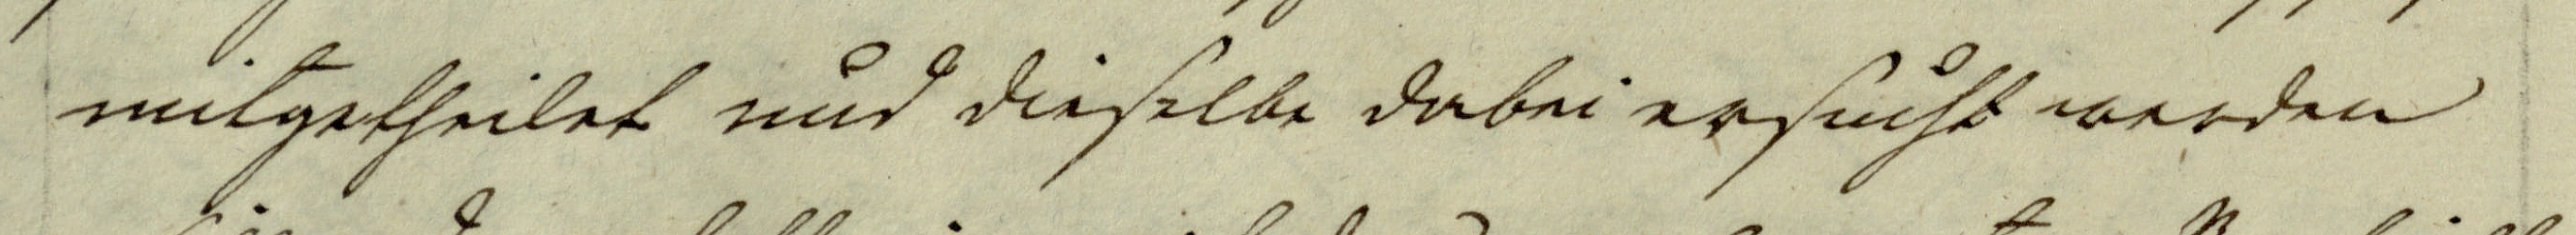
mitgetheilet und dieselbe dabei ersucht werden
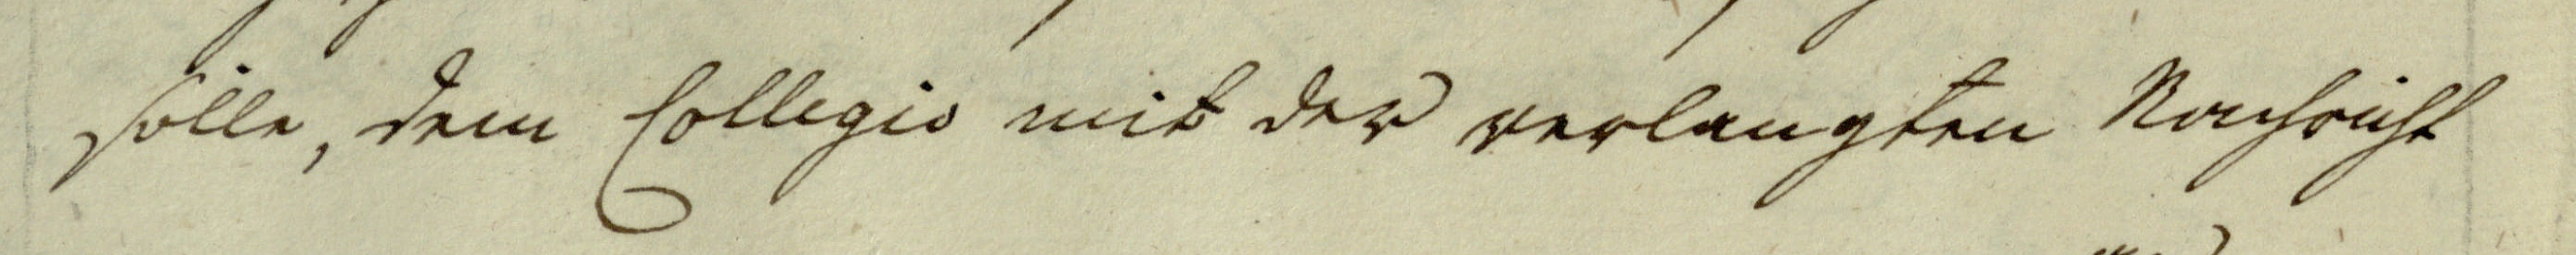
solle, dem Collegio mit der verlangten Nachricht
